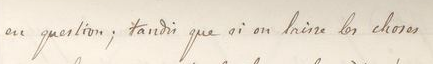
en question; tandis que si on laisse les choses
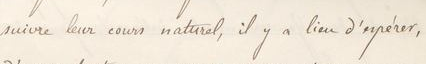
suivre leur cours naturel, il y a lieu d'espérer,
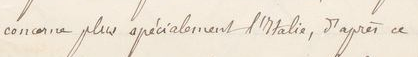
concerne plus spécialement l'Italie, d'après ce
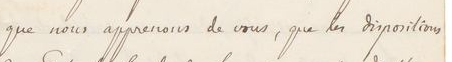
que nous apprenons de vous, que les dispositions
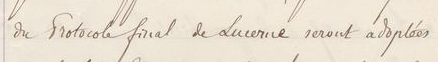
du Protocole final de Lucerne seront adoptées
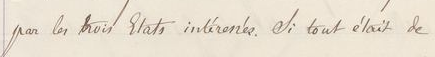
par les trois Etats intéressés. Si tout était de
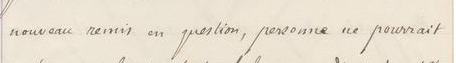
nouveau remis en question, personne ne pourrait
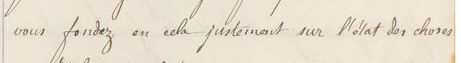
vous fondez en cela justement sur l'état des choses
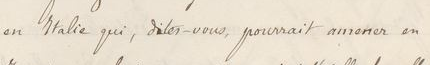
en Italie, qui dites-vous, pourrait amener en
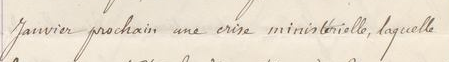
Janvier prochain une crise ministérielle, laquelle
